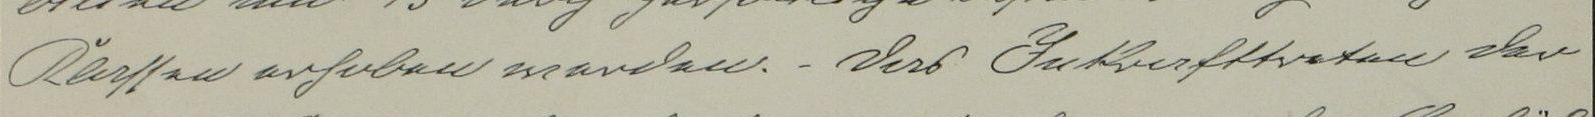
Klassen erhoben werden. – Das Inkrafttreten der
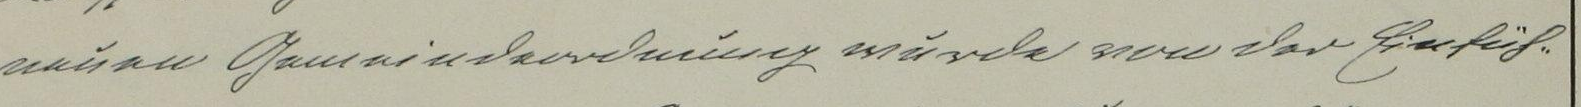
neuen Gemeindeordnung wurde von der Einfüh-
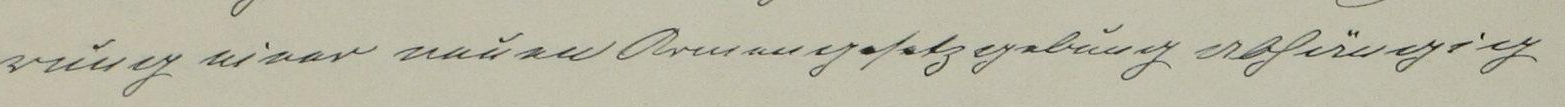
rung einer neuen Armengesetzgebung abhängig
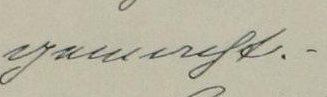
gemacht.
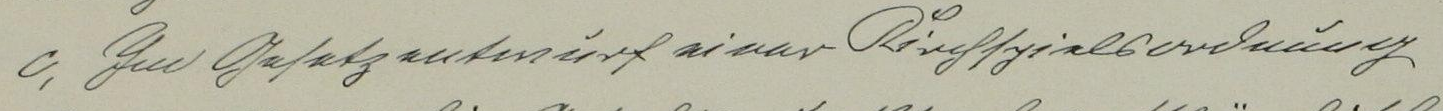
c. Im Gesetzentwurf einer Kirchspielsordnung
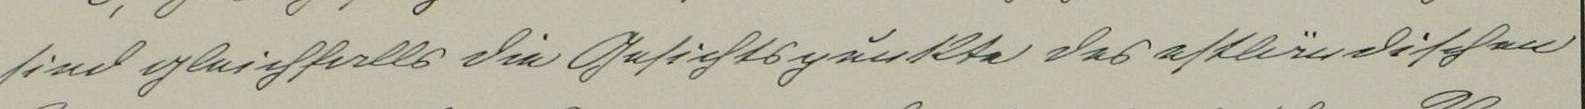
sind gleichfalls die Gesichtspunkte des estländischen
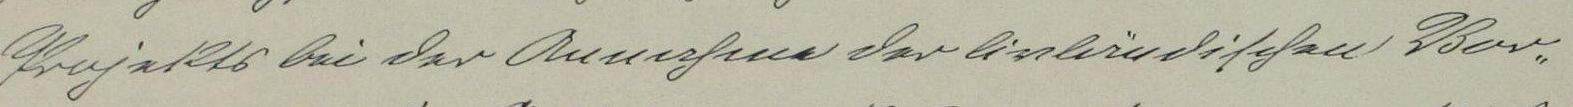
Projekts bei der Annahme der livländischen Vor-
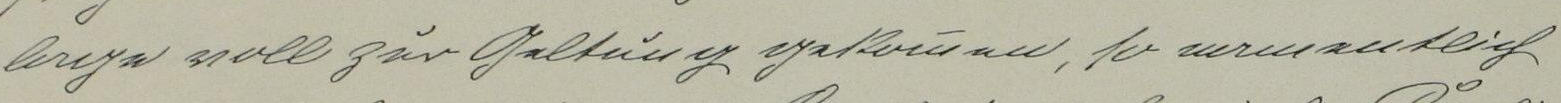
lage voll zur Geltung gekommen, so namentlich
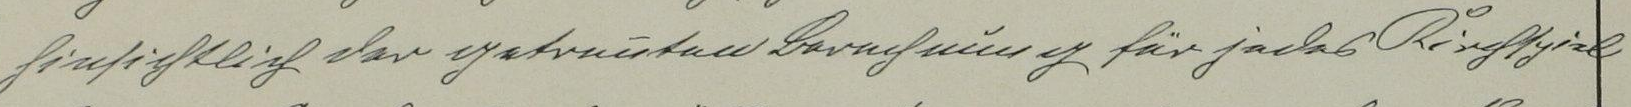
hinsichtlich der getrennten Berechnung für jedes Kirchspiel
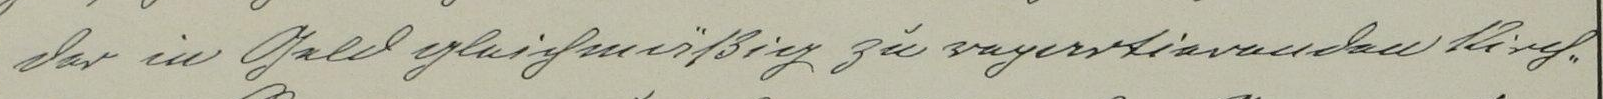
der in Geld gleichmäßig zu repartierenden kirch-
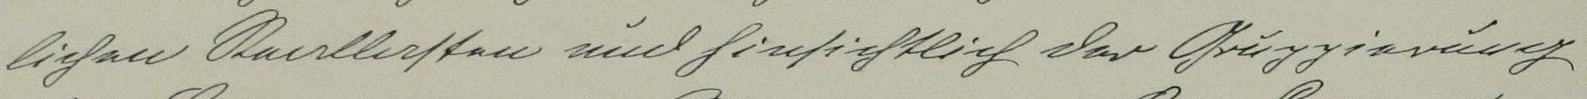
lichen Reallasten und hinsichtlich der Gruppierung
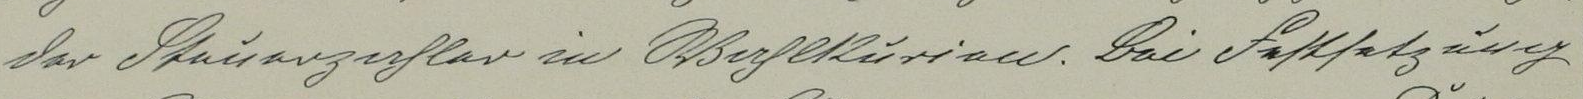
der Steuerzahler in Wahlkurien. Bei Festsetzung
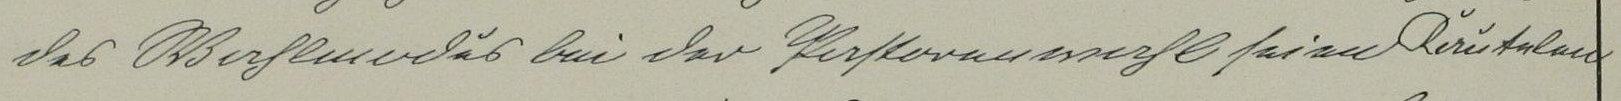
des Wahlmodus bei der Pastorenwahl seien Kautelen
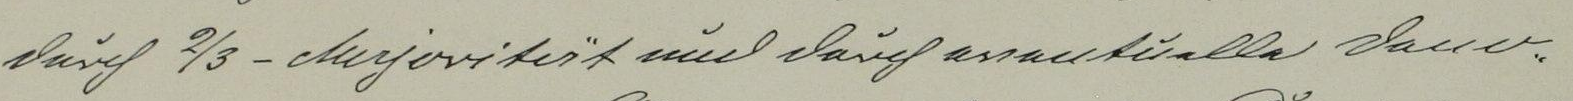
durch ⅔-Majorität und durch eventuelle Deno-
